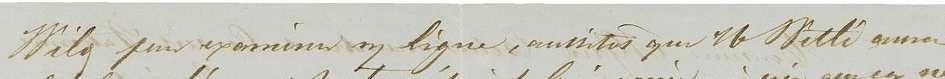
Wild pour examiner notre ligne, aussitot que M Wetli aura
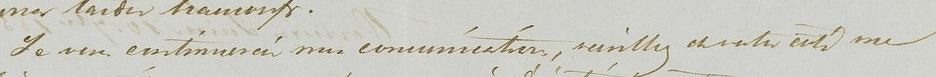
Je veux continuer à mes comunications, veuillez de votre coté me
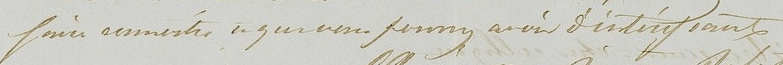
faire connaitre à que vous pensez avoir d'intéressant.
